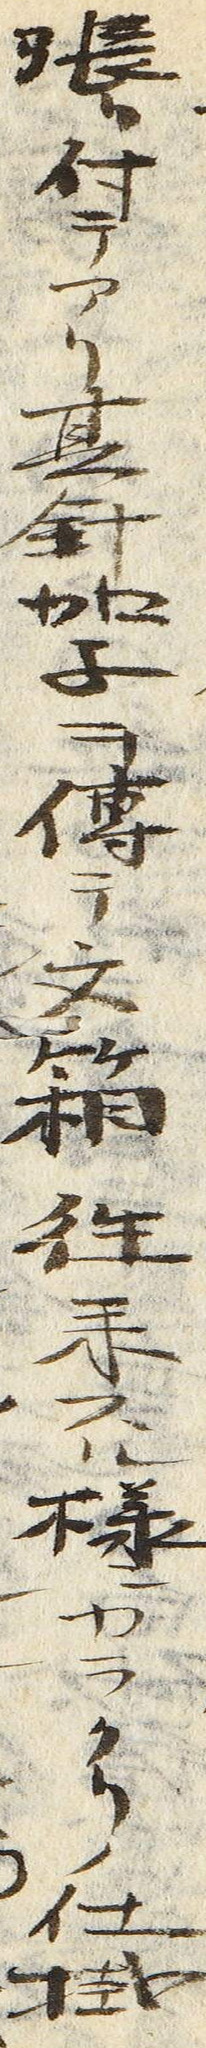張リ付テアリ其針かねヲ伝テ文箱往来スル様ニカラクリノ仕掛
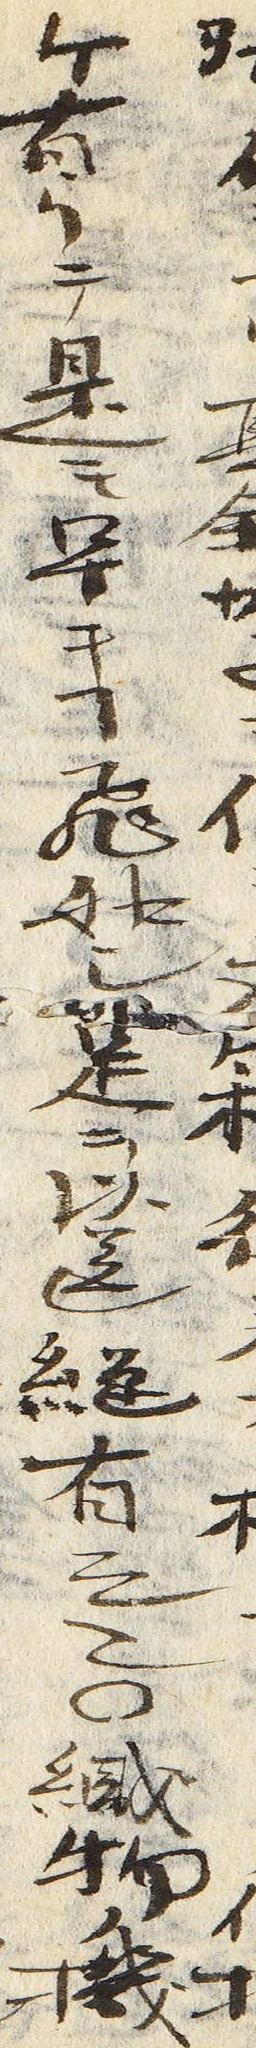ケ有リテ是モ早キ事飛如シ足ヲ以送継有之也〇織物ノ機
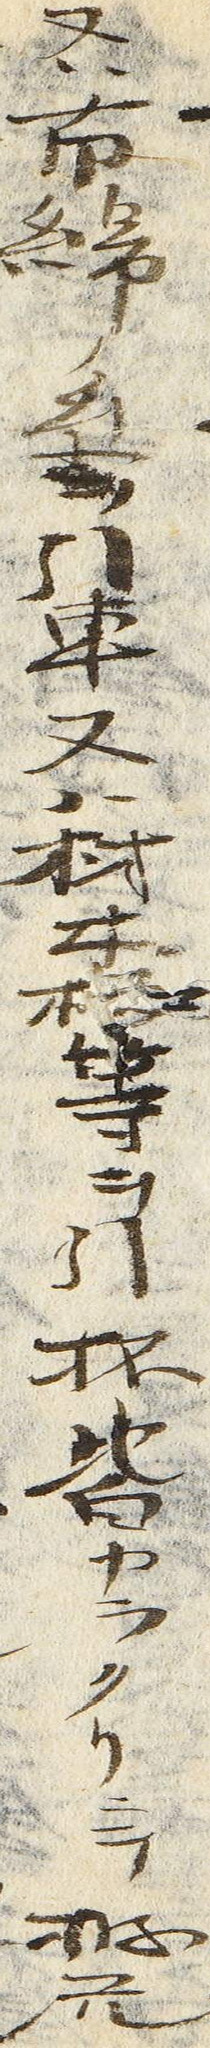又ハ布綿ノ糸ノ引車又ハ材木等ヲ引抔皆カラクリニテ拵ユル
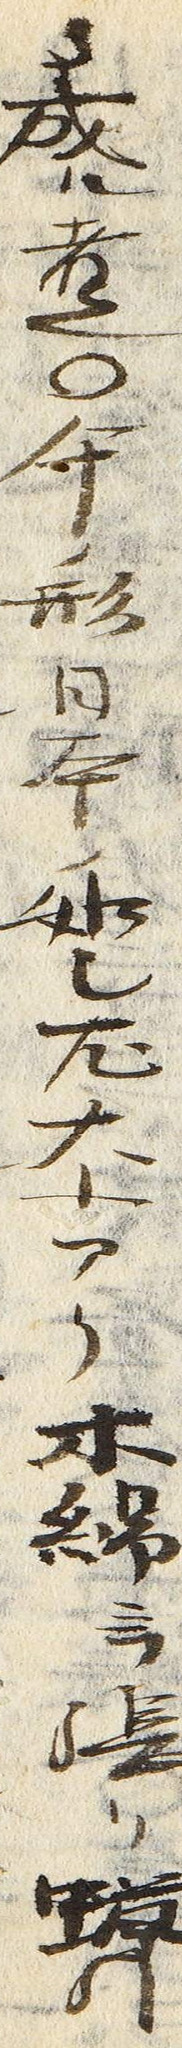る成ル者也〇傘ノ形日本ノ如シ尤大小アリ木綿ニテ張リ
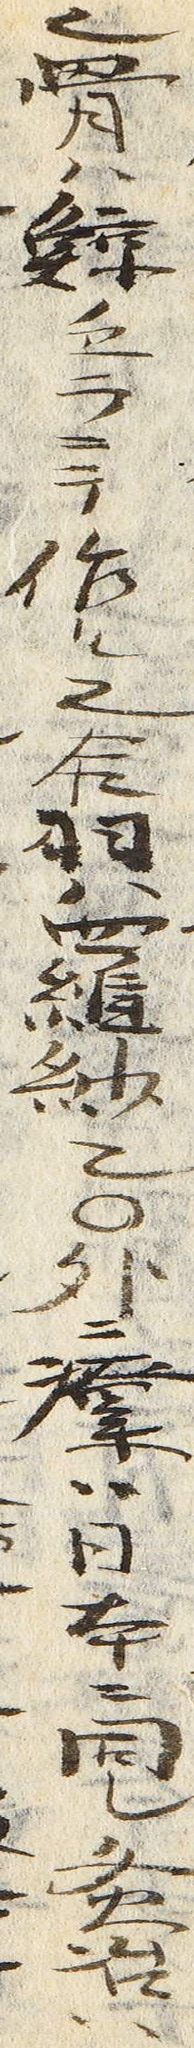也骨ハ鯨ノエラニテ作ル也合羽ハ羅紗〇外ニ療ハ日本ニ同シ灸治ハ
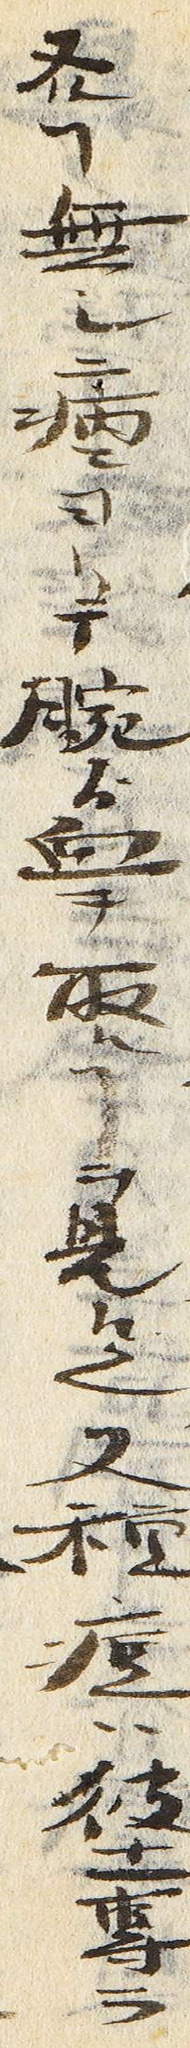スル事無シ病ニヨリテ腕ゟ血ヲ取ル事ヲ見ル也又種痘ハ彼等専ラ
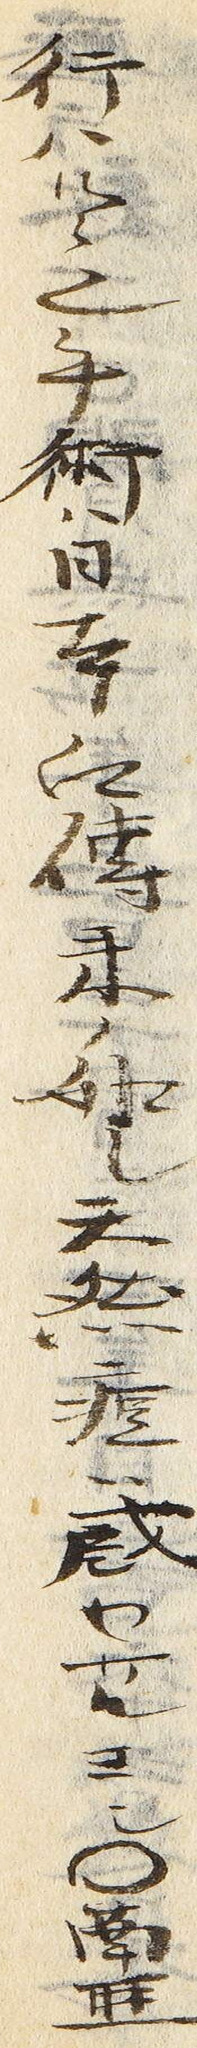行ハルヽ也手術ハ日本ヘ伝来ノ如シ天然痘ハ威サルヨシ〇南亜
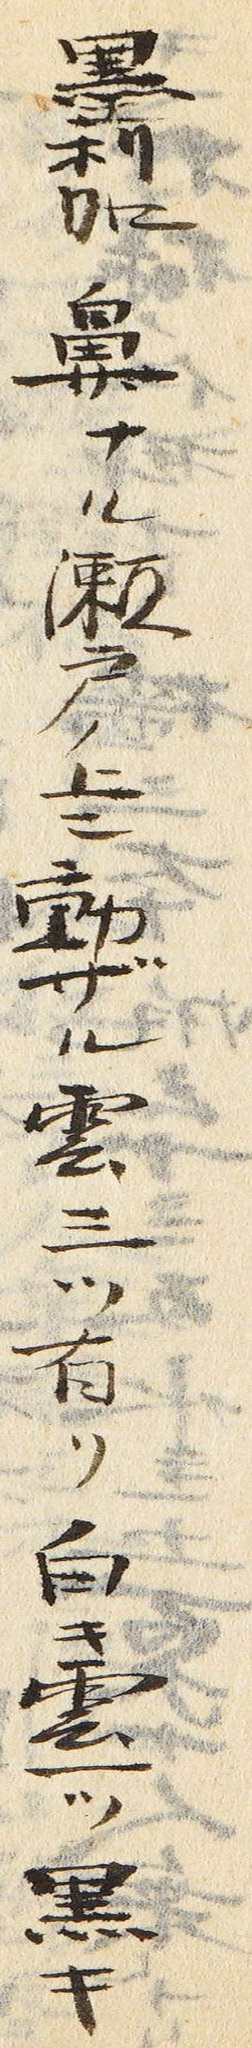墨利加鼻ナル瀬戸ノ上ニ動ザル雲ミツ有リ白キ雲一ツ黒キ
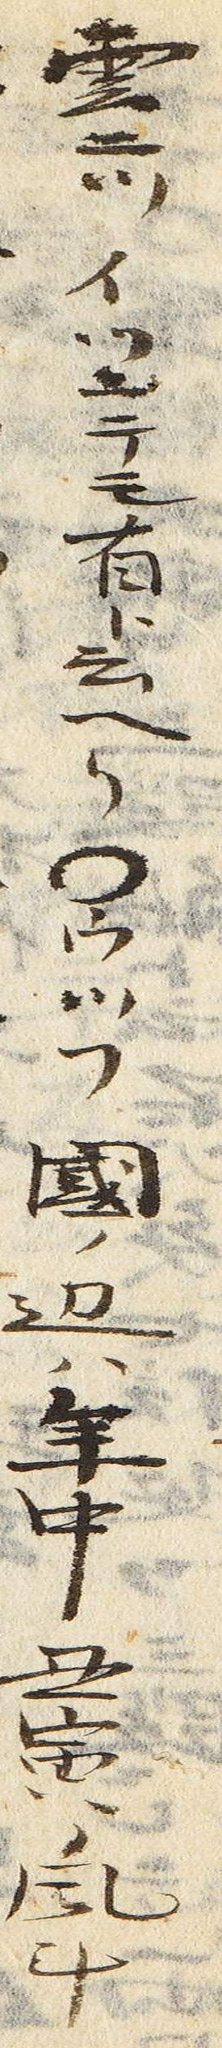雲二ツイツニテモ有ト云ヘリ〇ウツフ国ノ辺ハ年中丑寅ノ風計
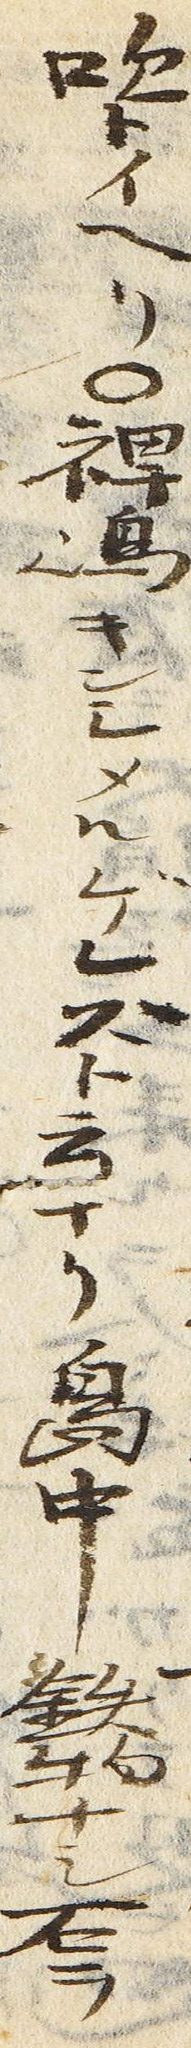吹トイヘリ〇稈嶋キンシメルゲレズト云ナリ畠中鉄物ナシ石ヲ
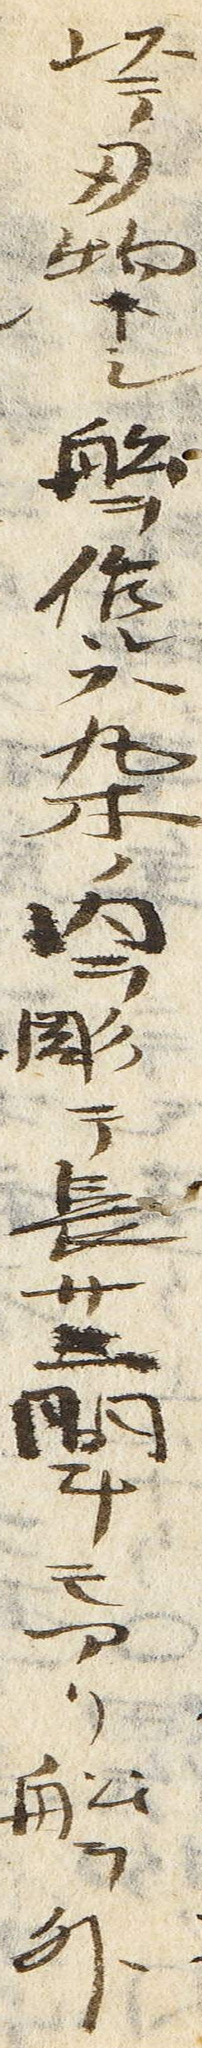以テ刃物トシ船ヲ作ル丸木ノ内ヲ彫テ長サ三間計モアリ船ヲ外
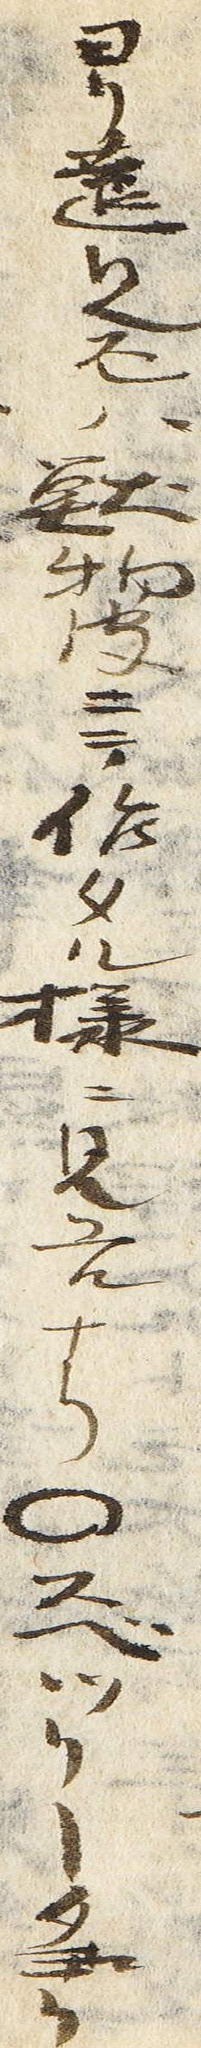ヨリ遠見スレハ獣物皮ニテ作タル様ニ見ユルナリ〇スベツリ❘タヨリ
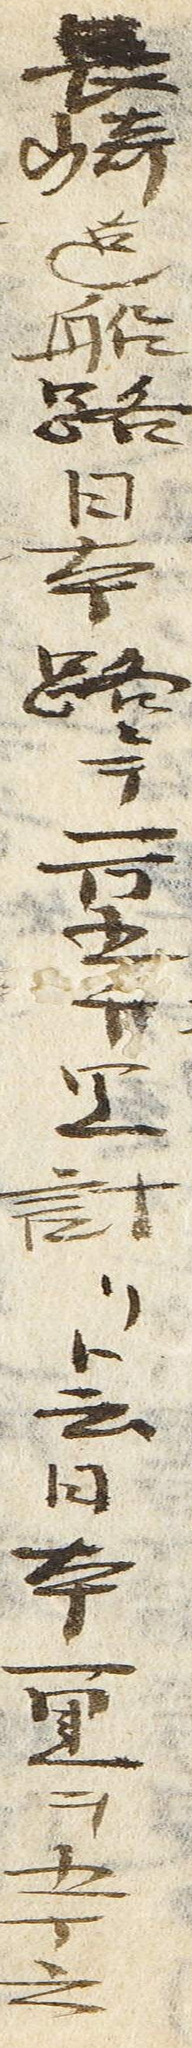長崎迄船路日本路ニテ一万五千里計リト云日本一里ヲ五十六
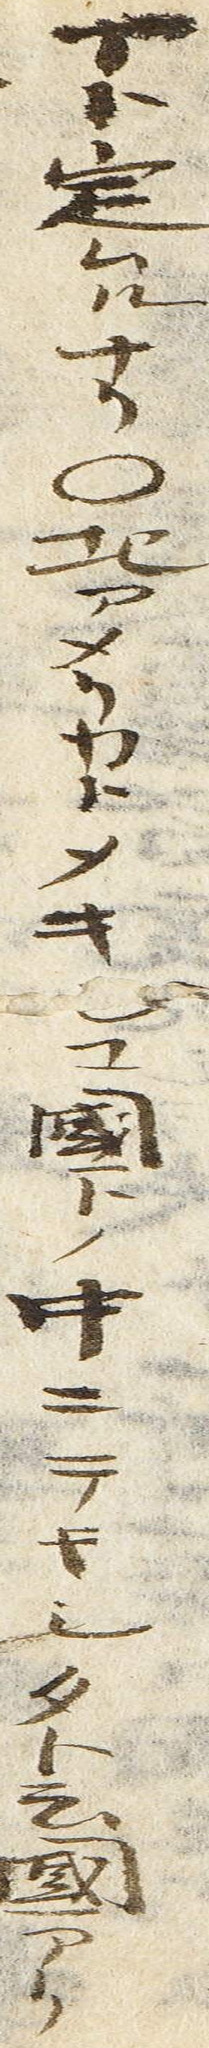丁ト定ムルナリ〇北アメリカトメキシコ国トノ中ニテキシタト云国アリ
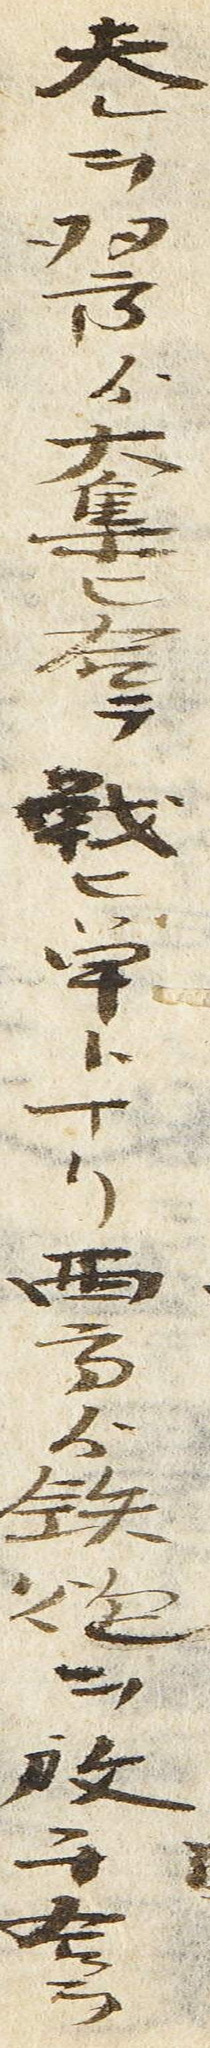夫レラ多方ゟ大集ヒ合テ戦ヒトナリ西方ゟ鉄炮ヲ放チ合ヲ
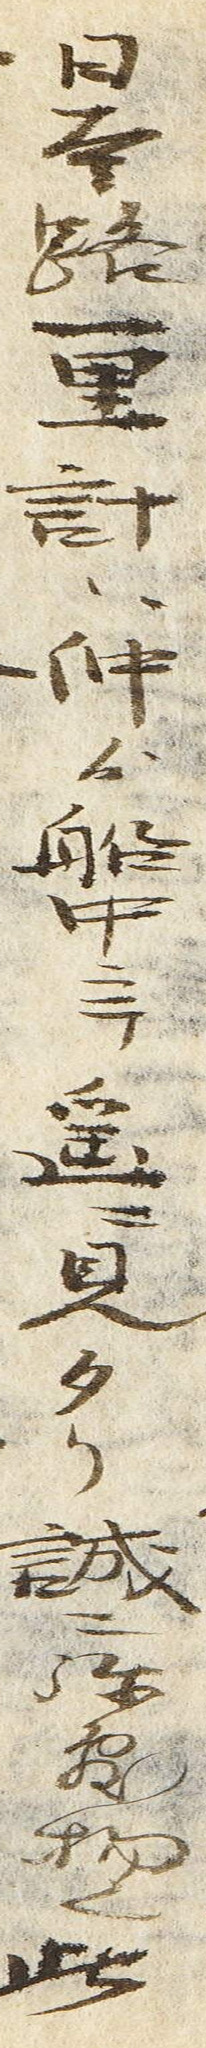日本路一里計ハ仲ゟ船中ニテ遥ニ見タリ誠ニ弥敷物也此
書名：漂流記聞
